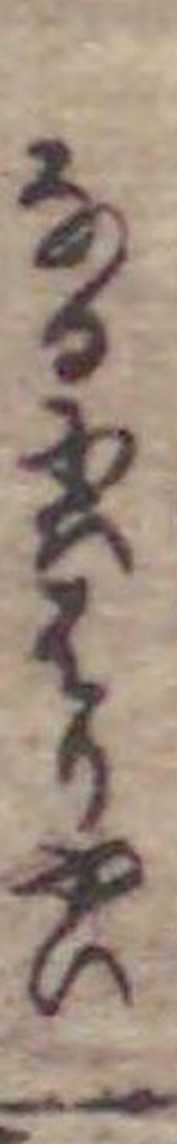なるにははりやい
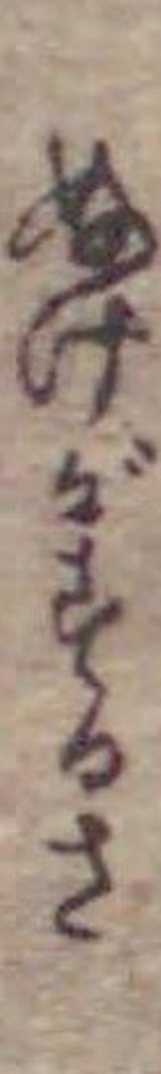ぬけがするさ

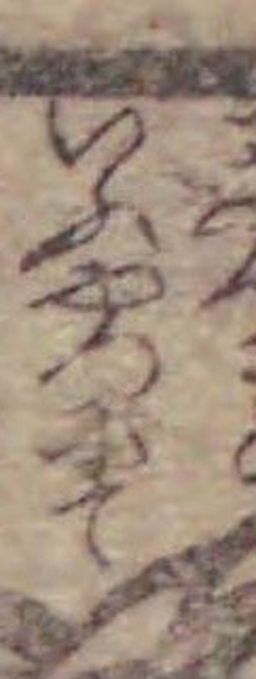いふやつにて
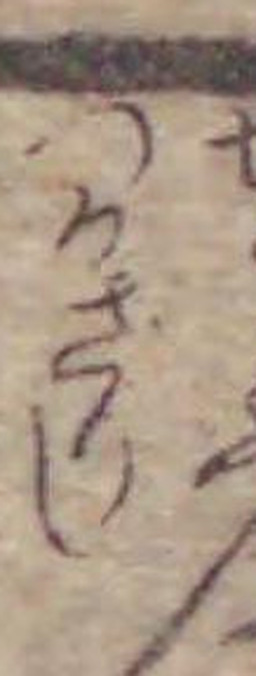つかさりし
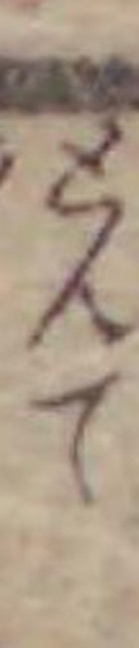とんて
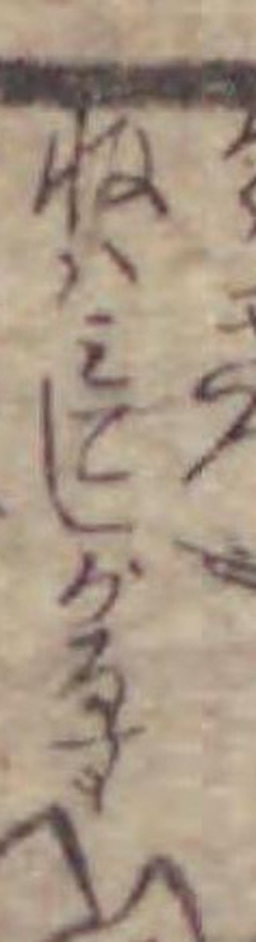ねはみこしがるす
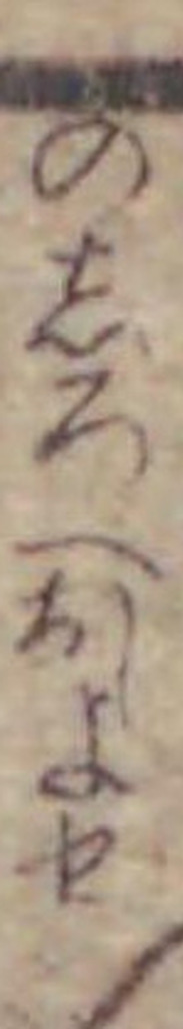のしろへおしよせ
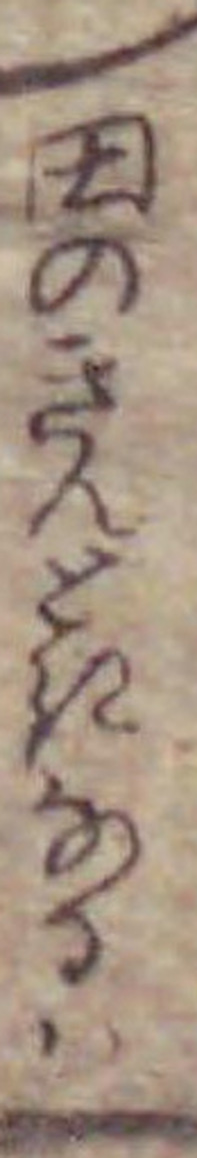田のきんときなるは
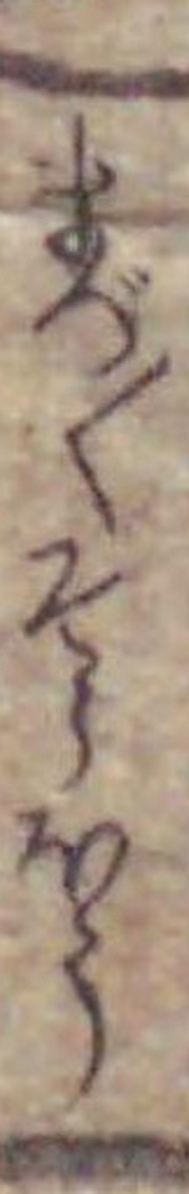まづ〳〵そうほう
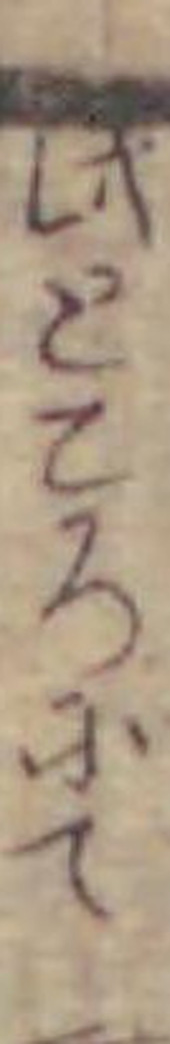此ところにて
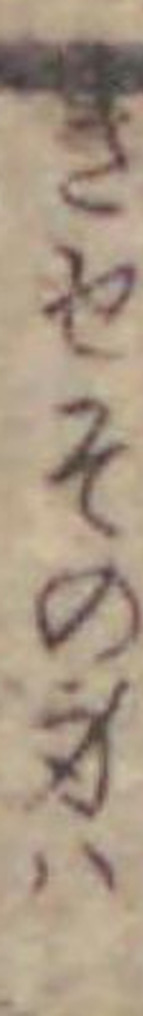させその身は
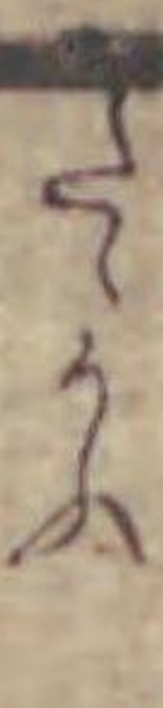たゝかふ
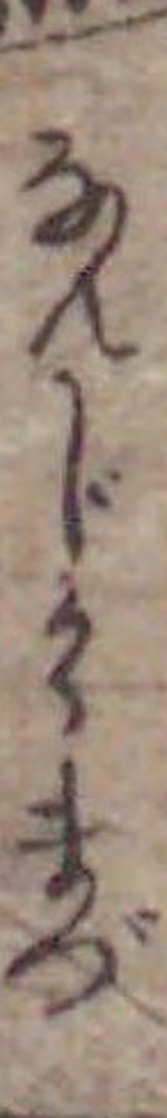なんじからまづ
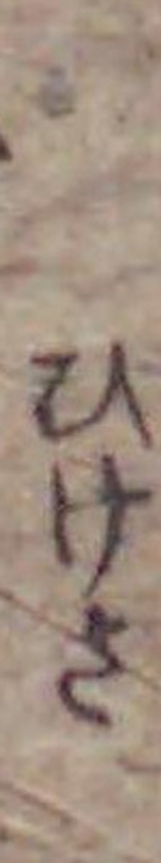ひけた
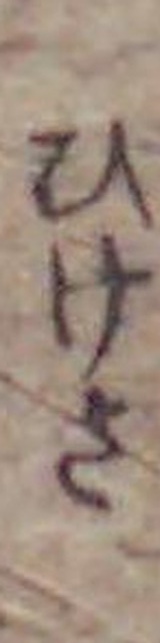ひけた
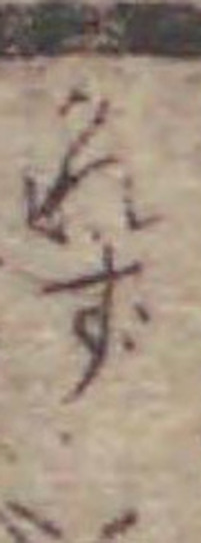かれず
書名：化物仲間破 : 2巻
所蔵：国立国会図書館 National Diet Library, JAPAN
